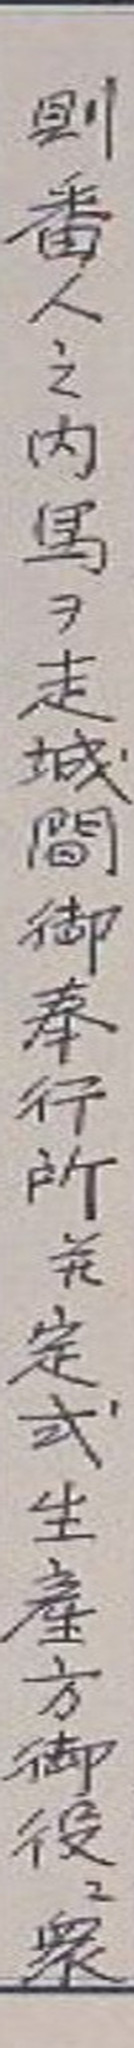則番人之内馬を走城間御奉行所并定式生産方御役々衆
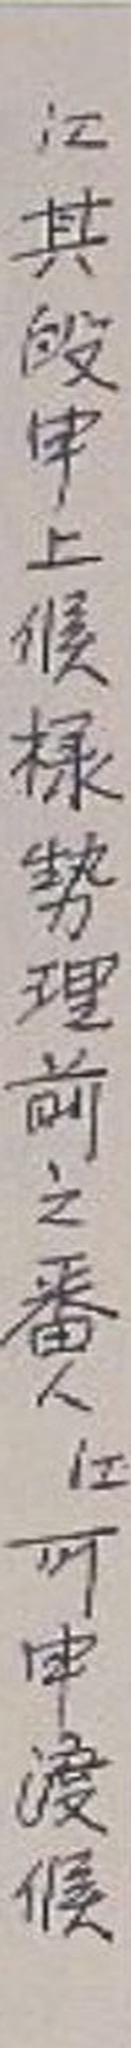え其段申上候様勢理前之番人え可申渡候

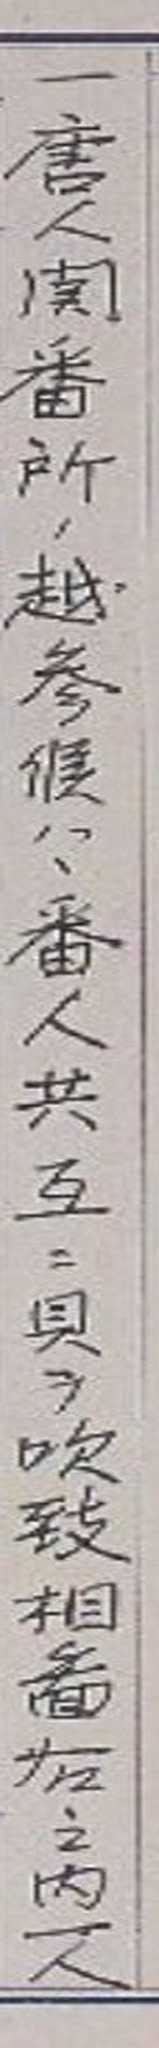一唐人関番所の越参候はゝ番人共互に貝を吹致相図右之内一人
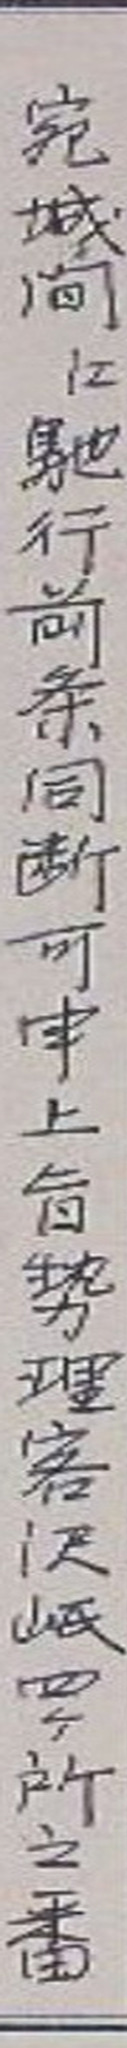宛城間え馳行前条同断可申上旨勢理客沢岻四ヶ所之番
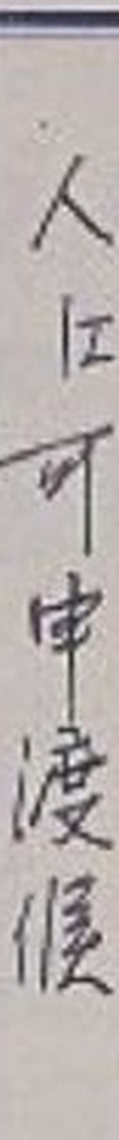人え可申渡候
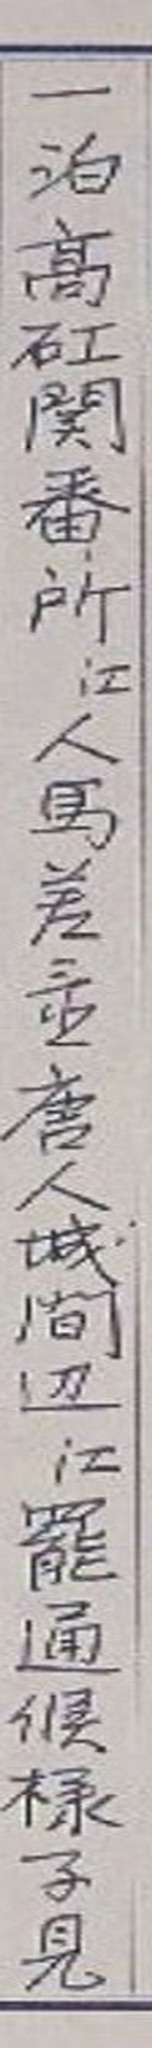一泊高矼関番所え人馬差置唐人城間辺え罷通候様子見
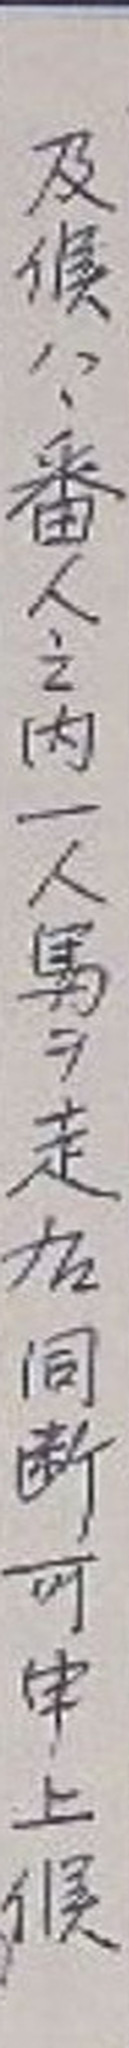及候はゝ番人之内一人馬を走右同断可申上候
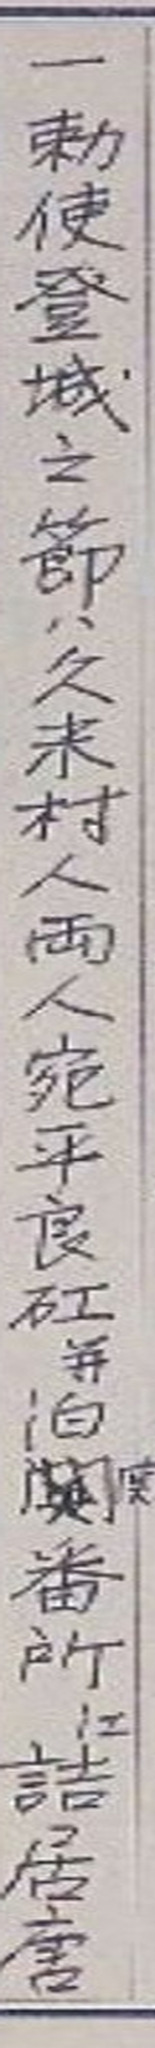一勅使登城之節は久米村人両人宛平良矼并泊関番所え詰居唐
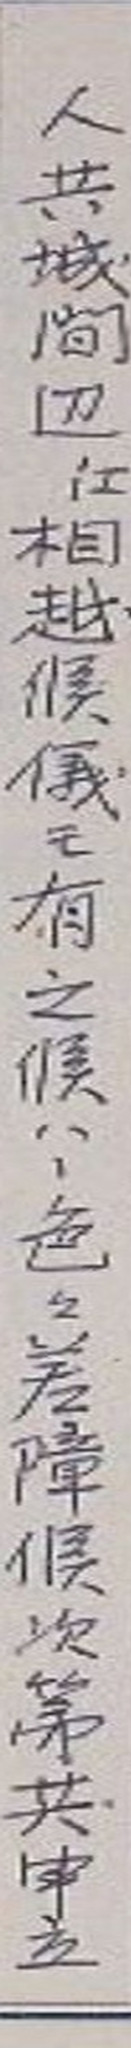人共城間辺え相越候儀も有之候はゝ色々差障候次第共申立
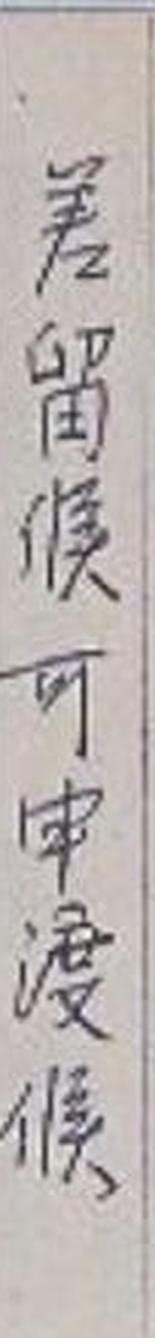差留候可申渡候
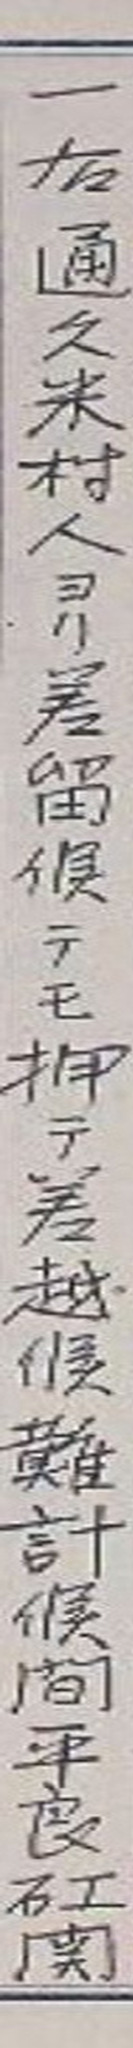一右通久米村人より差留候ても押て差越候難計候間平良矼関
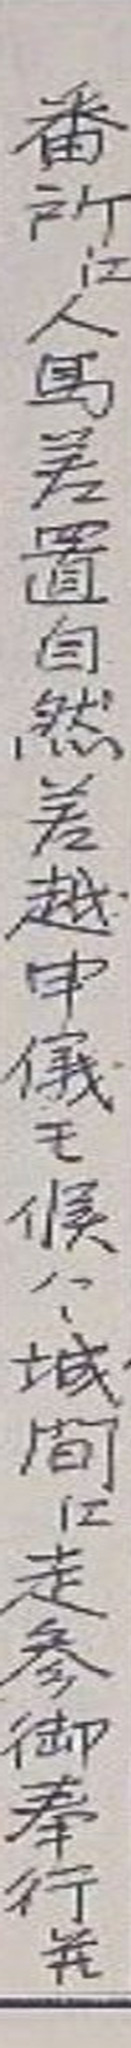番所え人馬差置自然差越申儀も候はゝ城間え走参御奉行并
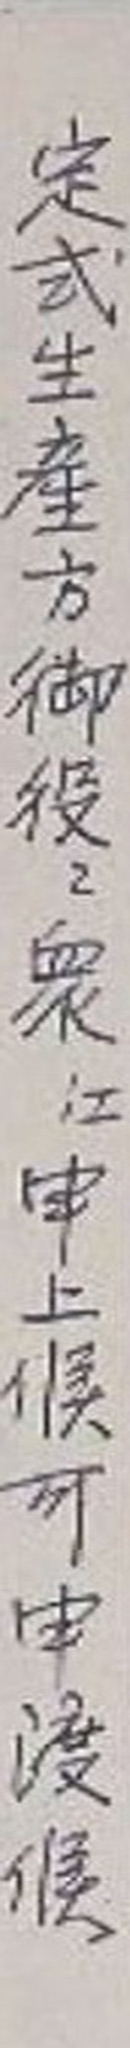定式生産方御役々衆え申上候可申渡候
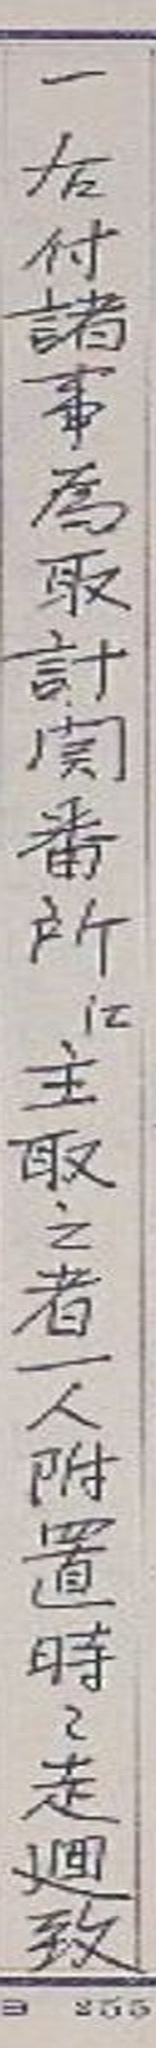一右付諸事為取計関番所え主取之者一人附置時々走廻致
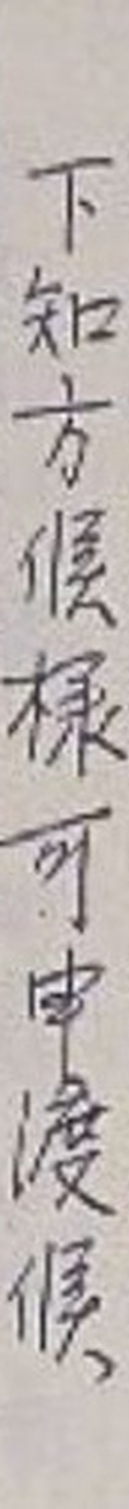下知方候様可申渡候
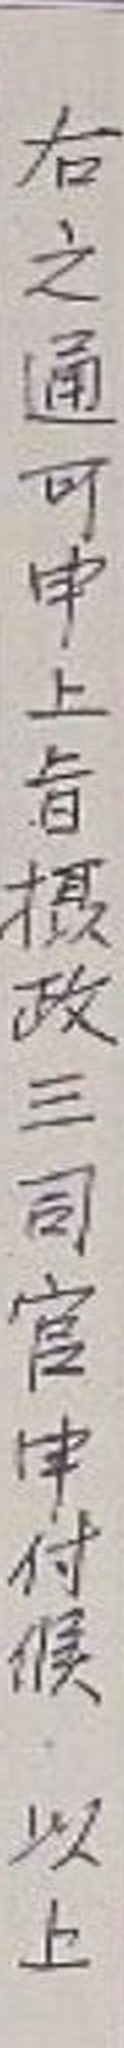右之通可申上旨摂政三司官申付候以上
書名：支那冊封使来琉諸記 下巻
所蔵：University of the Ryukyus Library
